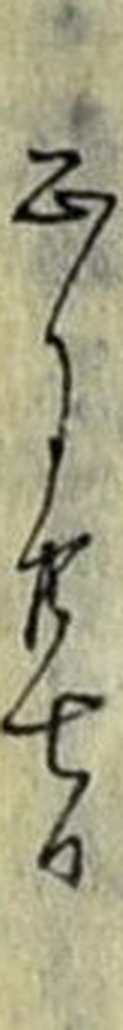正月廿七日
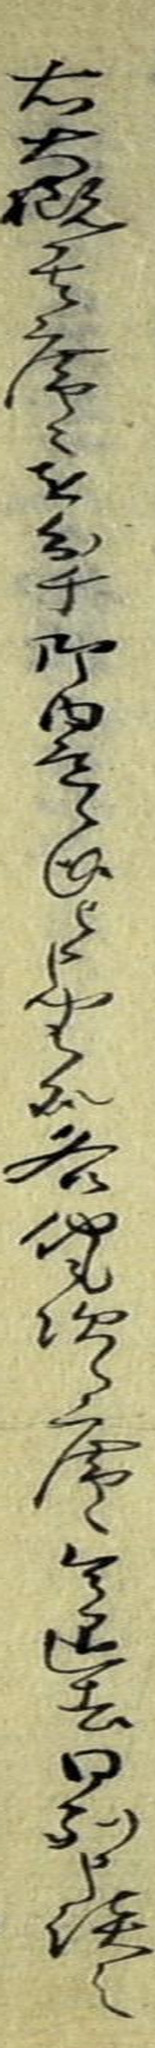右大概其席々を分ち御内意之趣被申聞候処各何も次之席へ令退去同列申談之
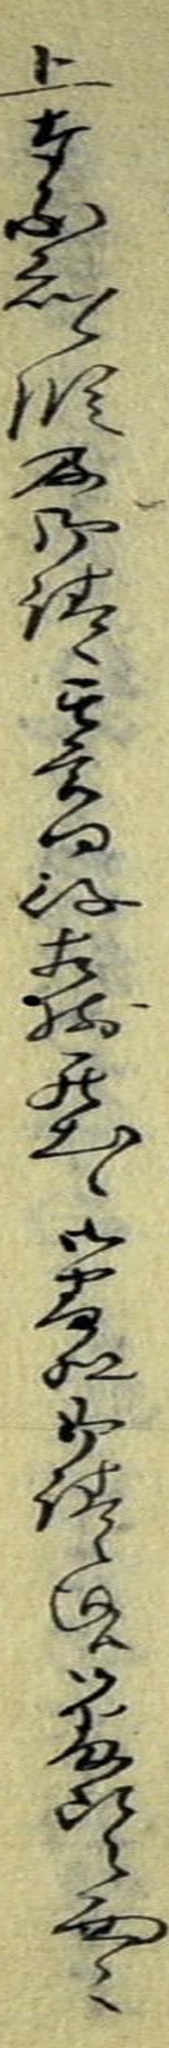上奉承知候段及御請候其節同役相揃罷出候御番組御請候趣は御番頭之面々
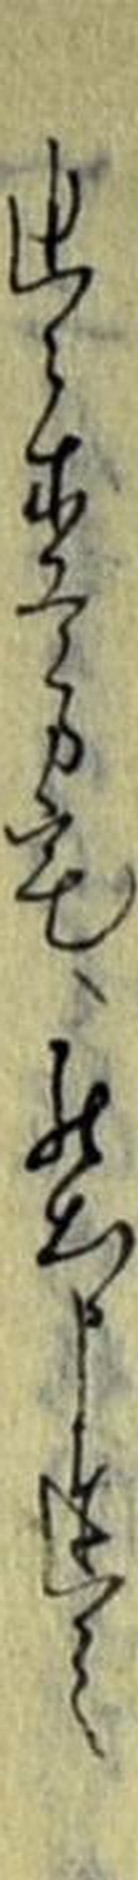追々杢方宅へ罷出申達之

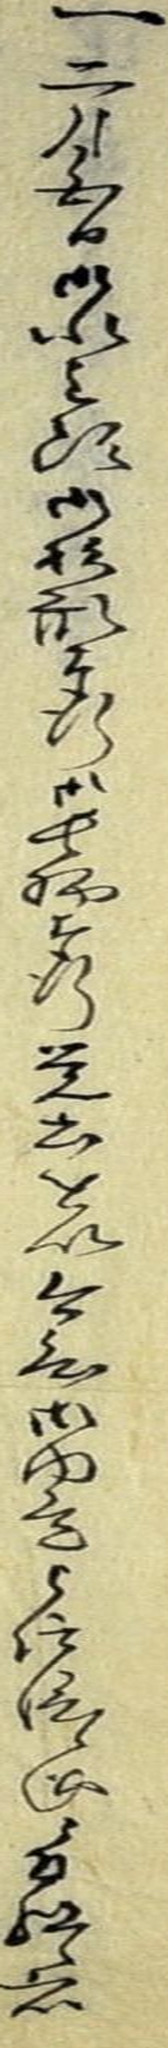一二月五日御水主頭御杉形奉行御長柄奉行覚書を以今度御内意被仰渡候趣に付組之者
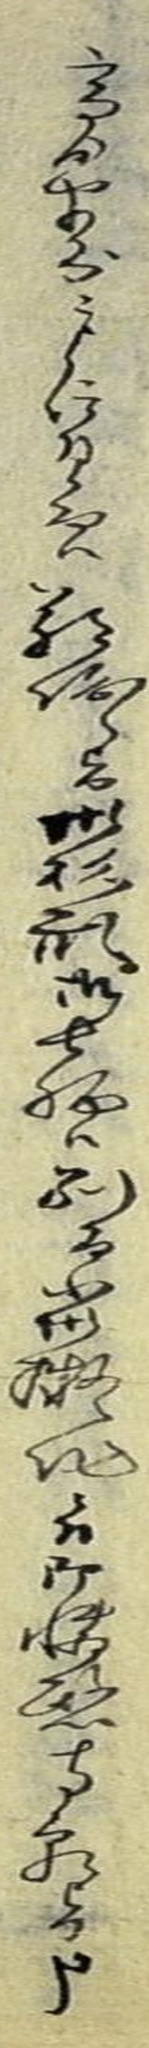高ゟ半分に被仰付候而は難儀之旨御杉形御長柄は別而少御擬作に付御憐愍奉願旨申
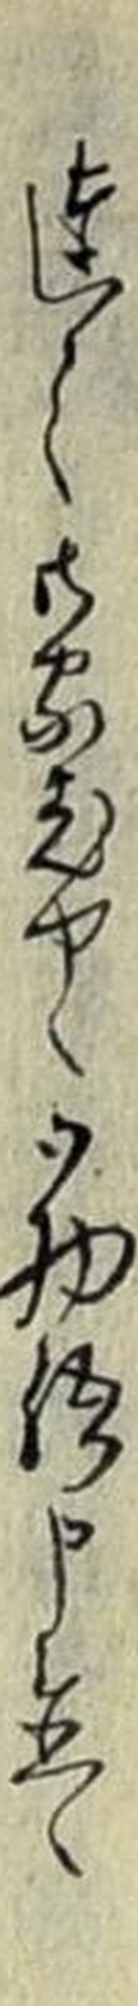達之御家老中へ御物語申置候
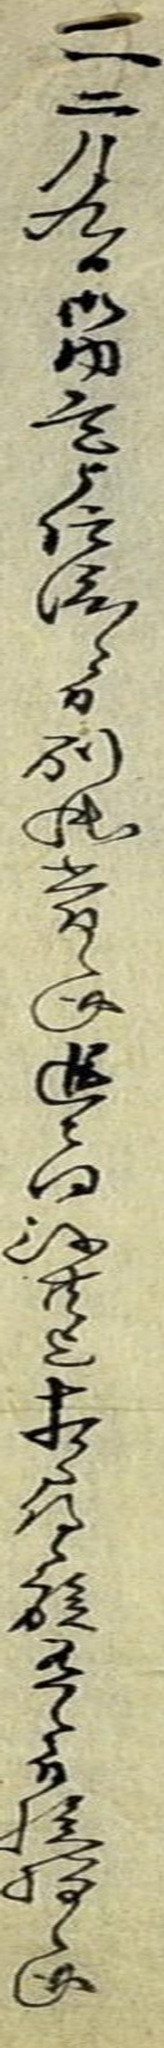一二月九日御内意被仰渡候に付別紙書付之趣追々同役共迄相尋候族有之候に付挨拶之趣
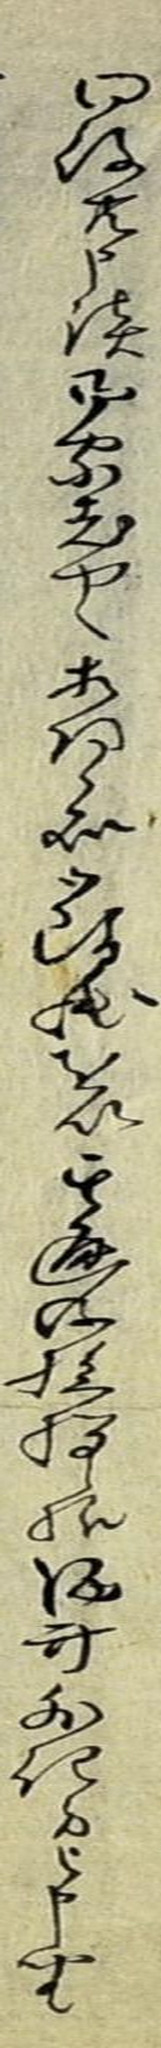同役共申談御家老中へ相伺候処御附紙を以其通及挨拶候様酒井外記方被申聞候
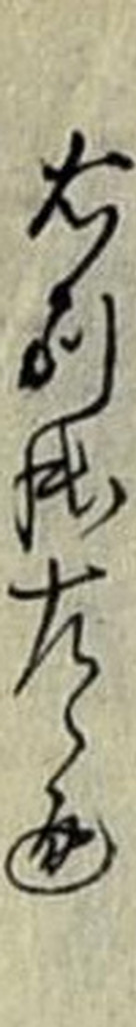右別紙左之通
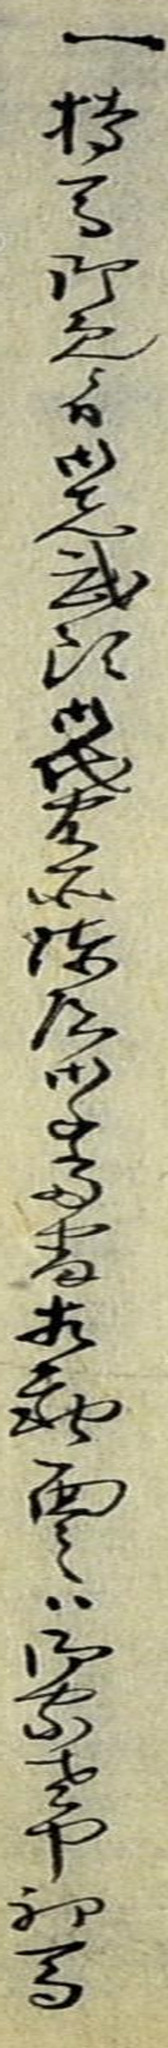一持馬御免に付御先武頭御代官所陣屋御手当番相勤候面々は御家老中初馬
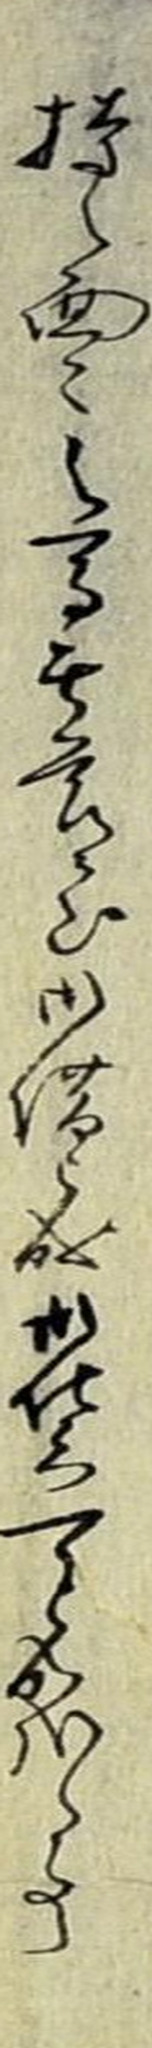持之面々之馬其節に至御借被成御貸可被成哉之事
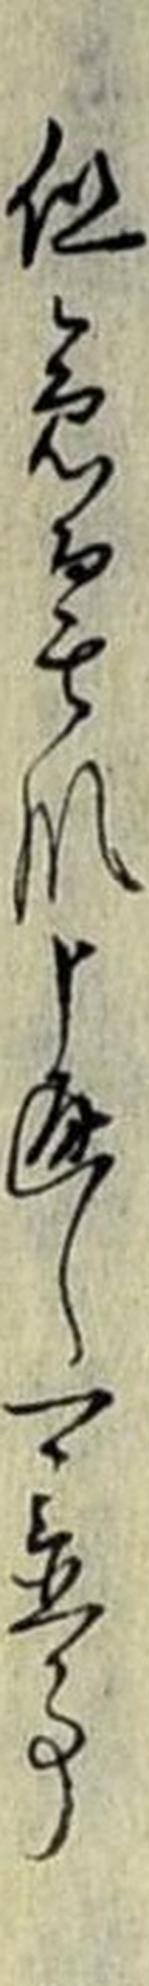但兼而其段申通之可置事
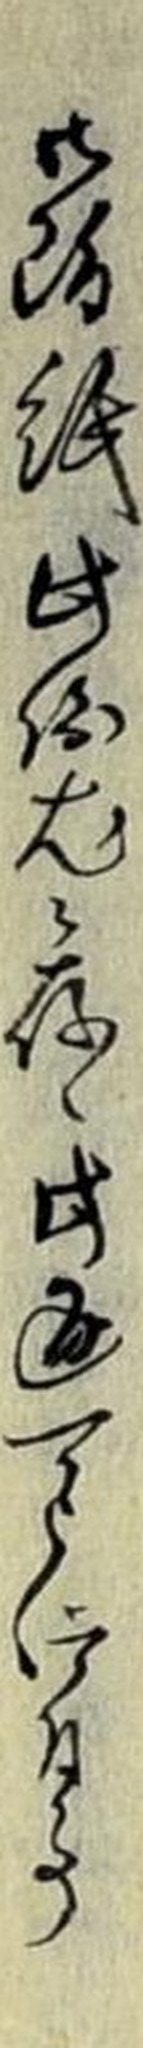御附紙此儀尤に存候此通可被仰付事
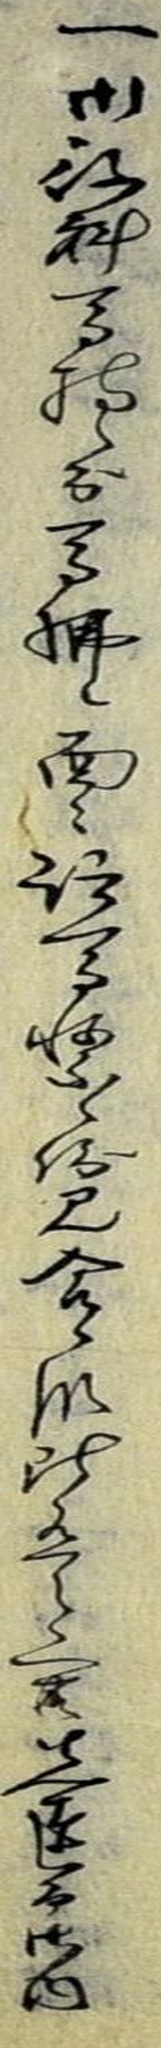一御役料馬持之分馬払候面々跡馬繋之儀見合之段断有之候へ共先達而御内
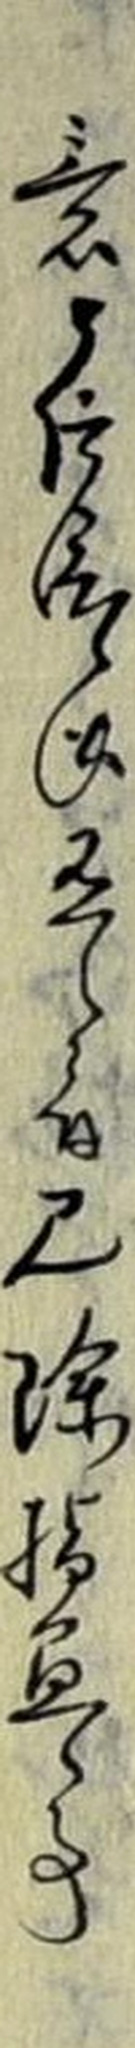意被仰渡候趣有之に付見除指置候事
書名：命令之部 二
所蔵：福井県文書館 Fukui Prefectural Archives
